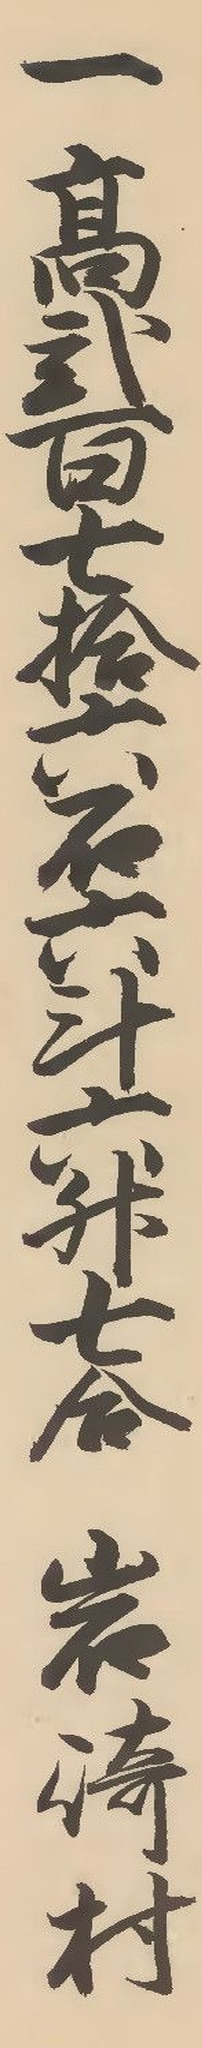一高弐百七拾六石六斗六升七合岩崎村
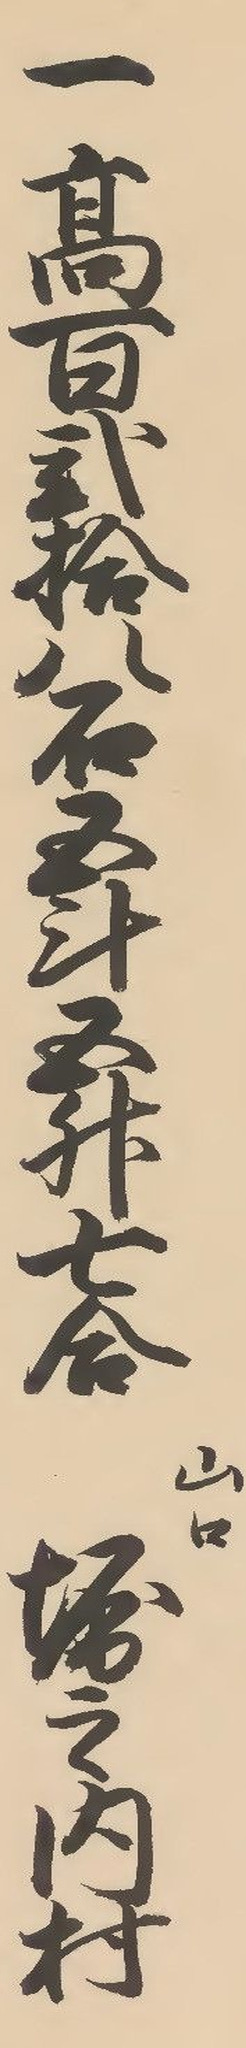一高百弐拾八石五斗五升七合堀之内村
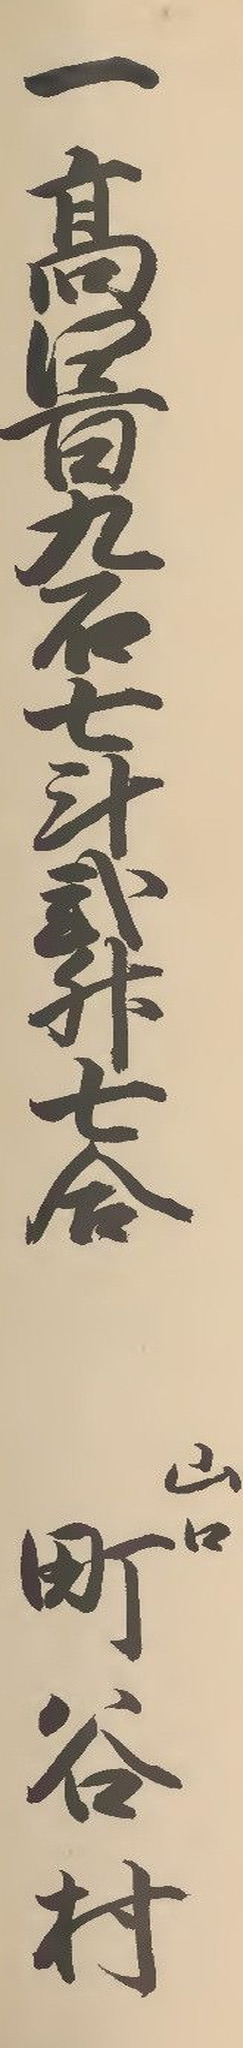一高四百九石七斗弐升七合町谷村
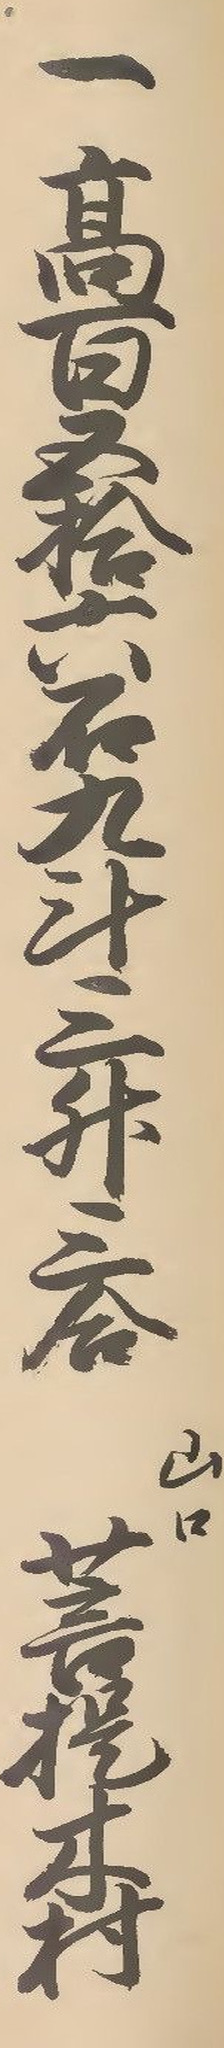一高百五拾六石九斗三升三合菩提木村
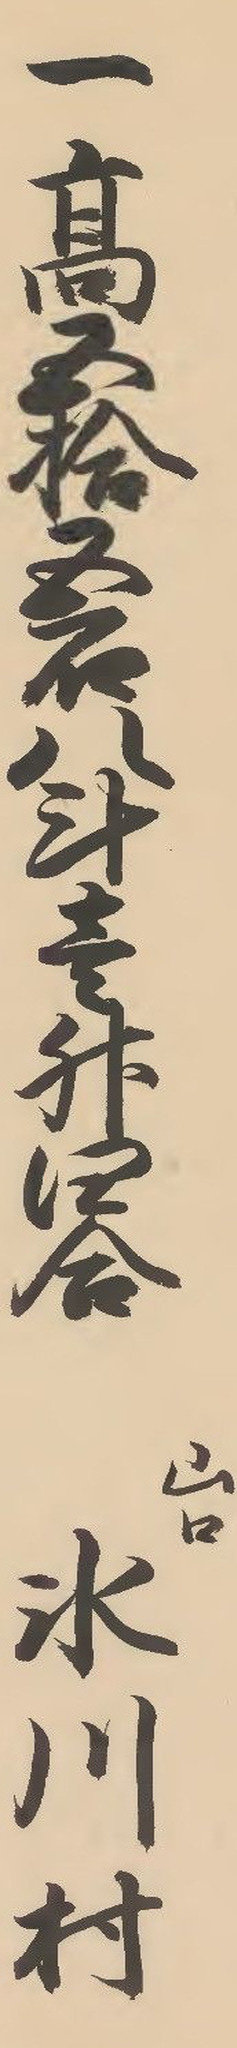一高五拾五石八斗壱升四合氷川村
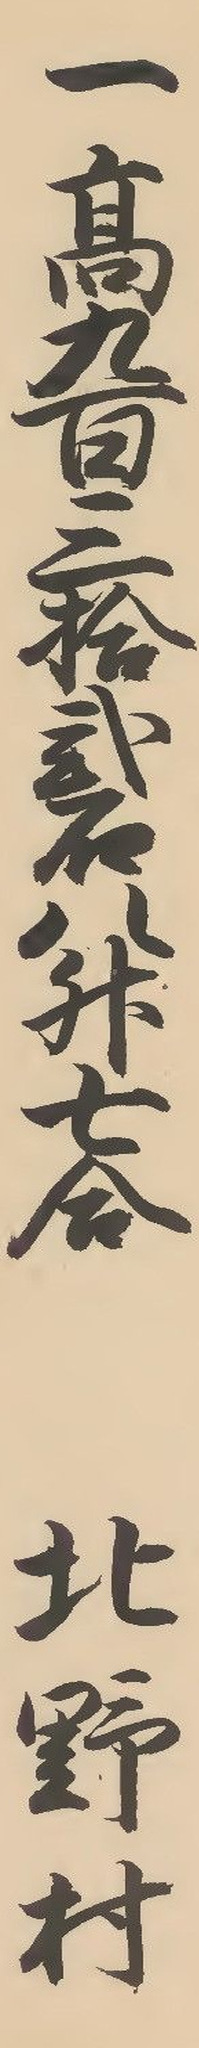一高九百三拾弐石八升七合北野村
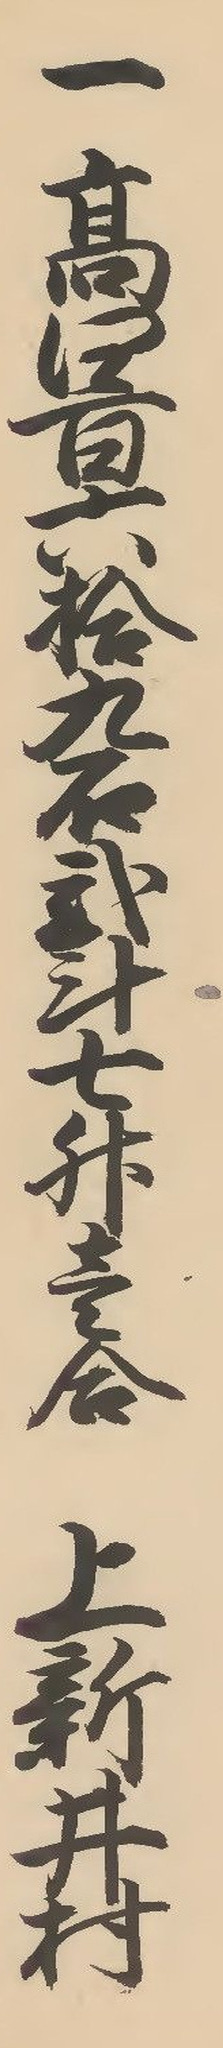一高四百六拾九石弐斗七升壱合上新井村

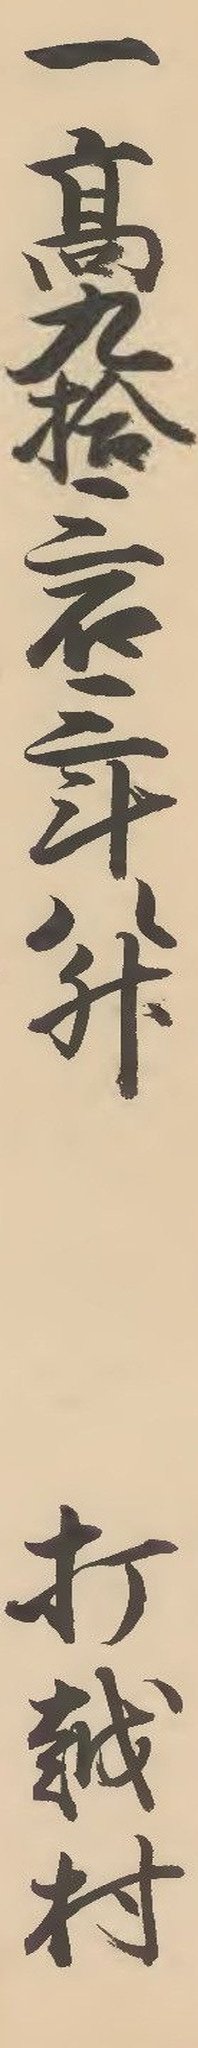一高九拾三石三斗八升打越村
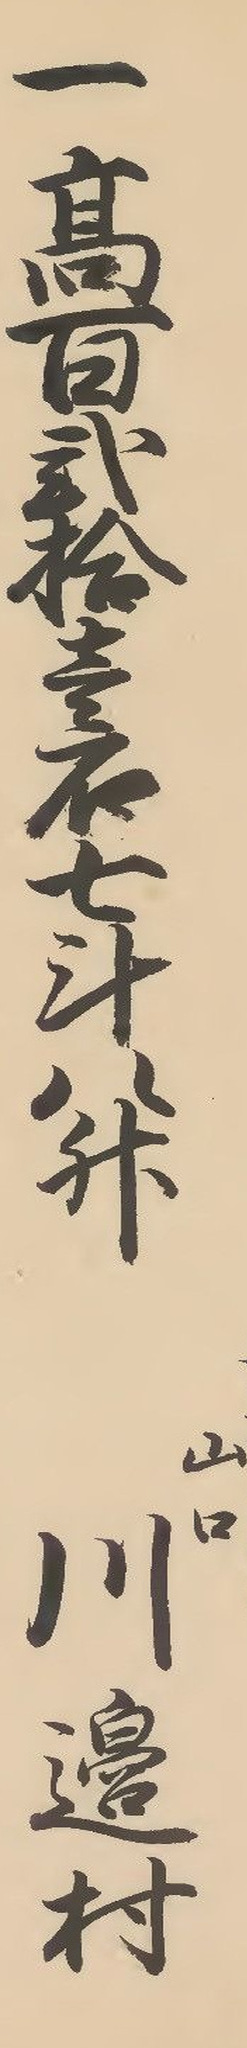一高百弐拾壱石七斗八升川邉村
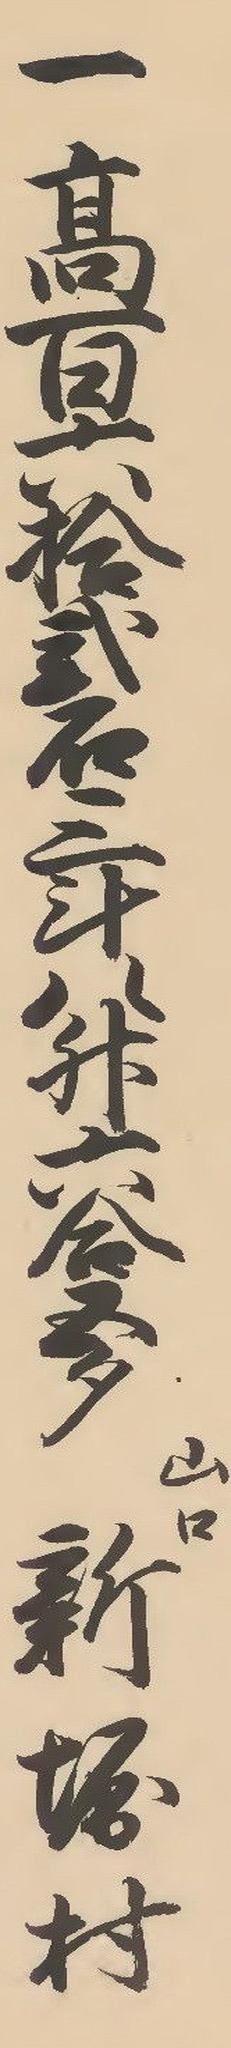一高百六拾弐石三斗八升六合五勺新堀村
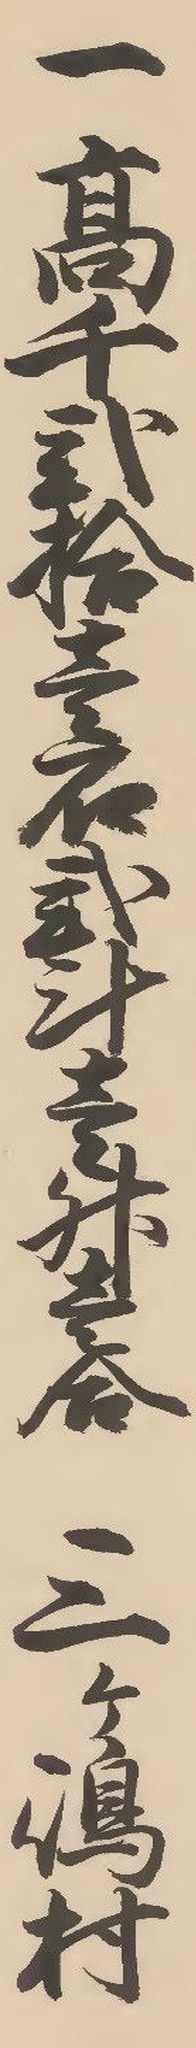一高千弐拾壱石弐斗壱升壱合三ヶ嶋村
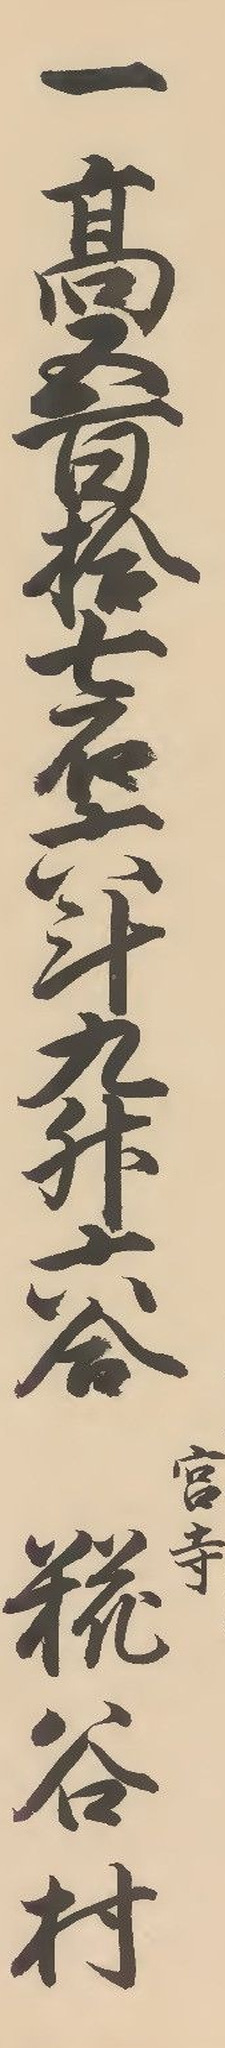一高五百拾七石六斗九升六合糀谷村
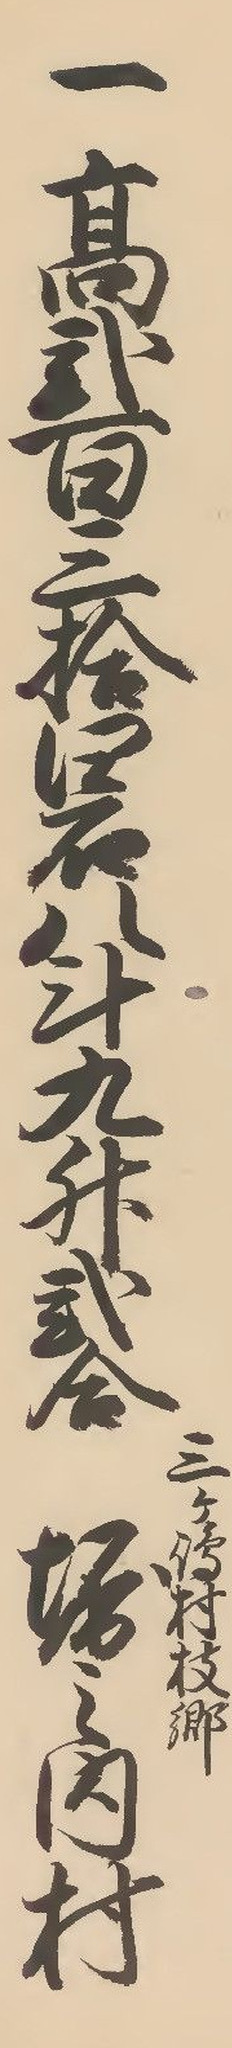一高弐百三拾四石八斗九升弐合堀之内村

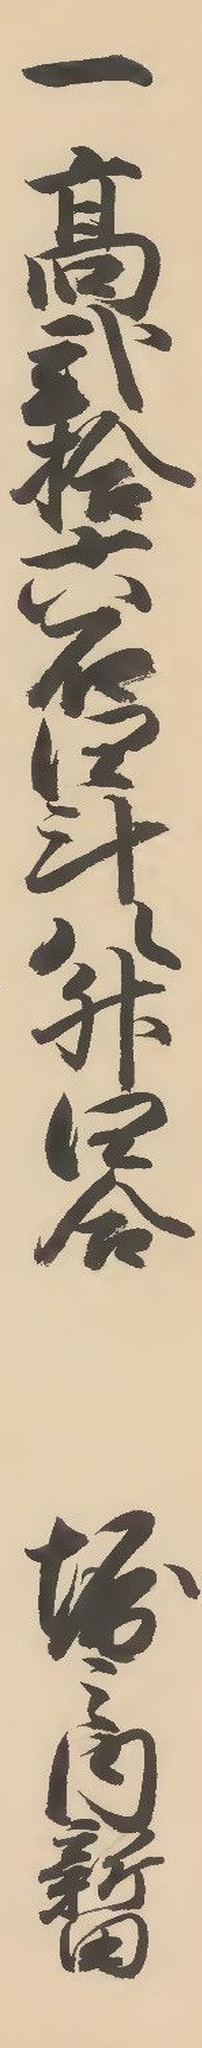一高弐拾六石四斗八升四合堀之内新田
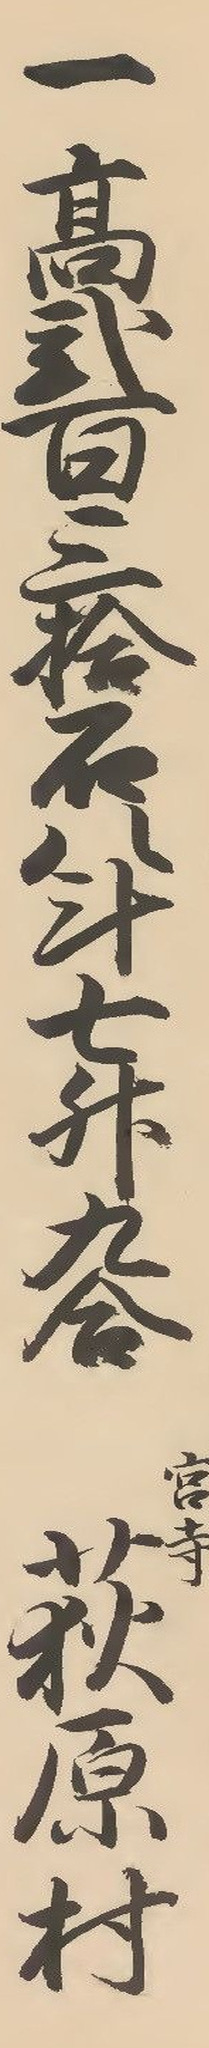一高弐百三拾石八斗七升九合萩原村
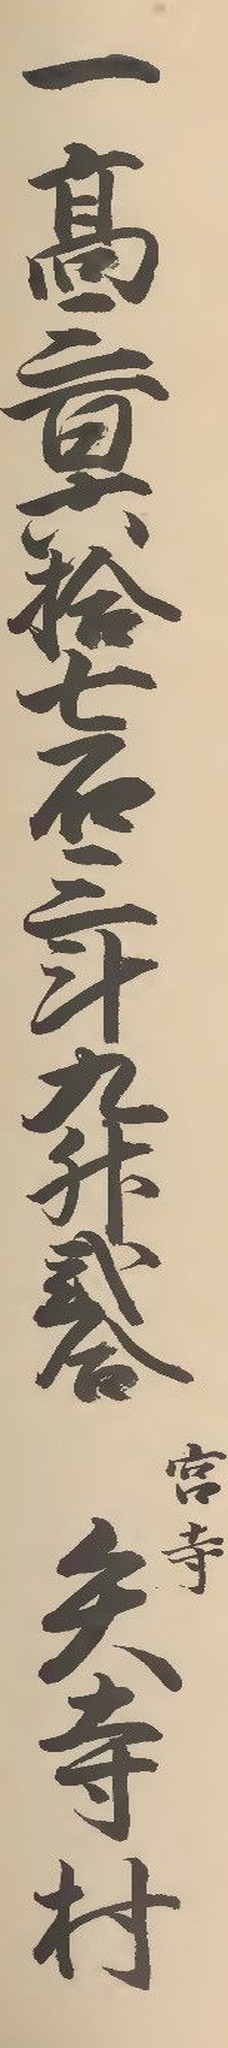一高三百六拾七石三斗九升弐合矢寺村
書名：武蔵国郷帳　上
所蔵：国立公文書館 National Archives of Japan
